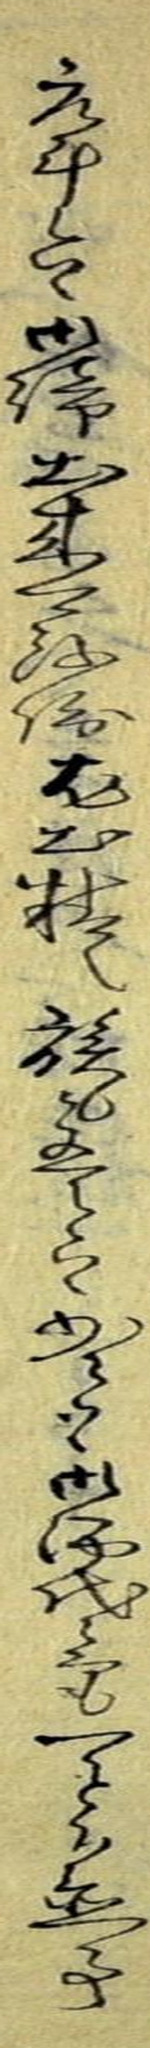取斗候はヽ御締出来可致儀尤出精之族も有之候はヽ少々つヽ御酒代に而も可被下置事
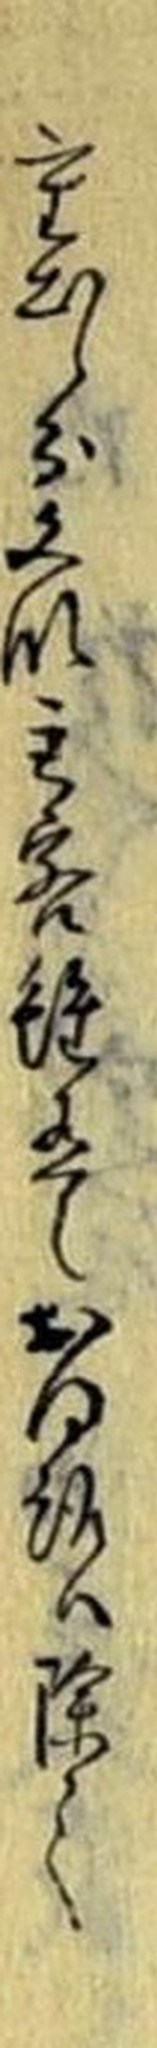重出之分文段主客雖有之出同趣は除之御奉行
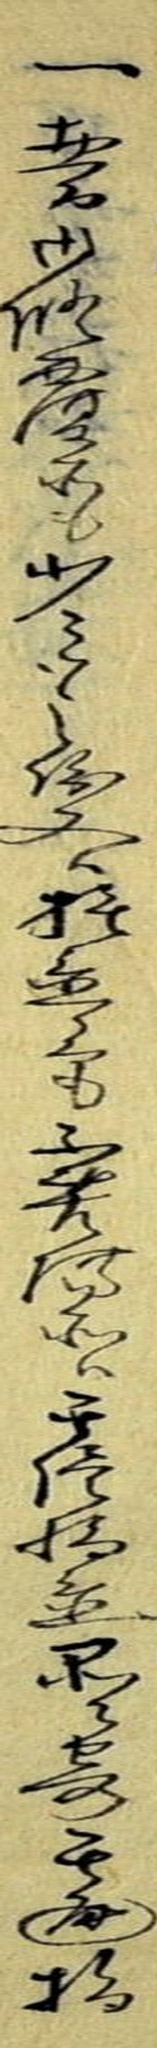一惣而御修覆所も少々ツゝ之儀又捨置候而も不苦場所は其侭指置品々に寄其通指
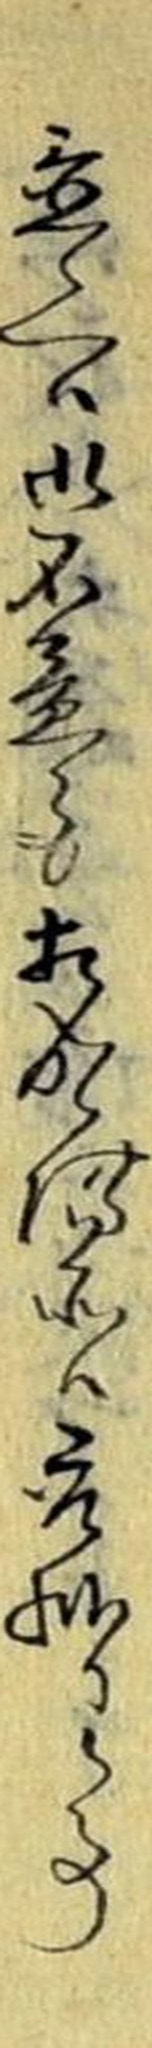置候へは御不益にも相成場所は取掛り候事
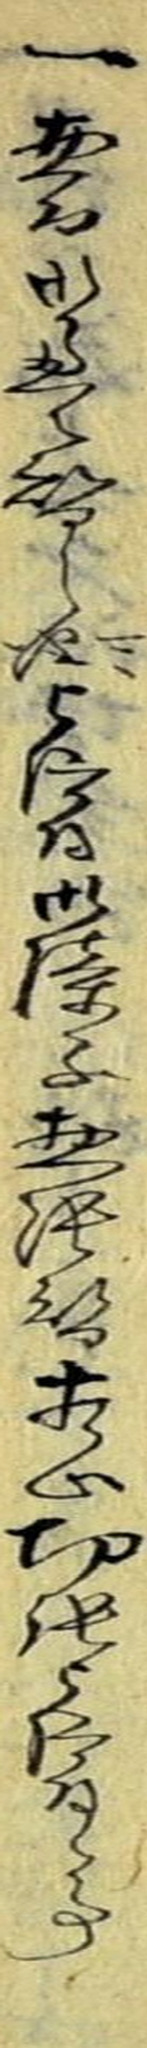一惣而御畳替之儀被仰付御障子惣張替相止切張被仰付候事
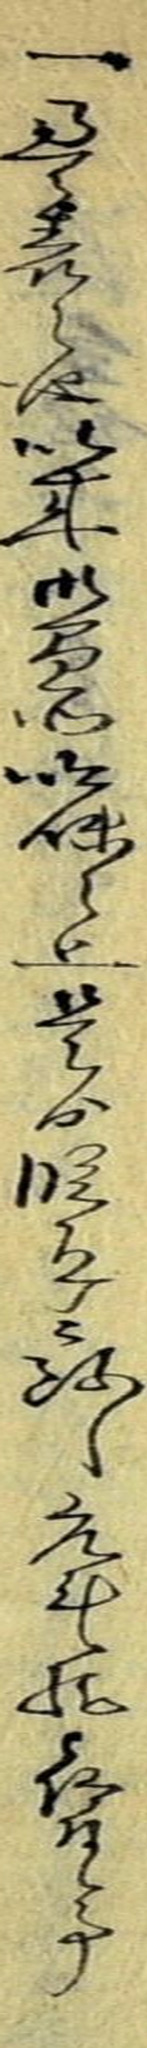一畳表之儀以来御間所吟味之上是ゟ段下ヶに致し取斗候様被仰付候事
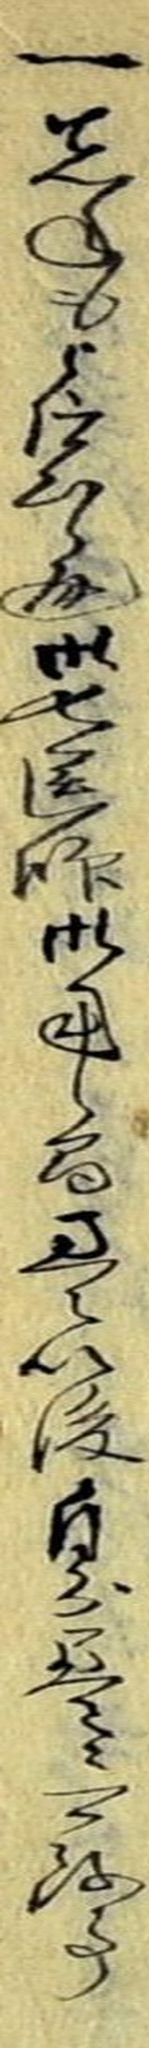一先年も被仰出候通御匙医師御用之間畳以後自分畳に可致事
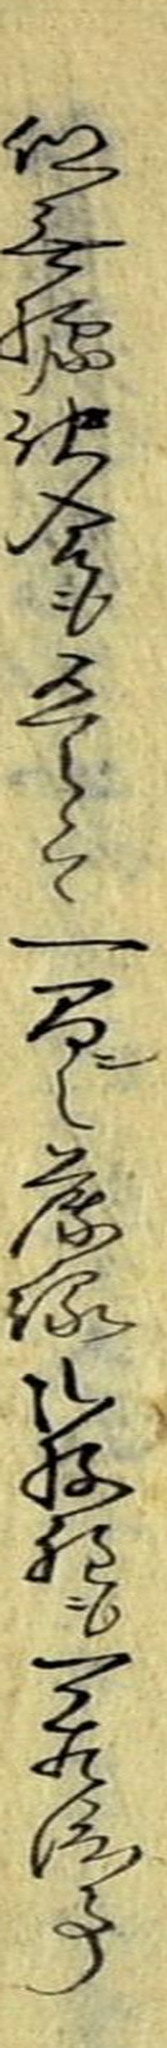但無拠訳合も有之候はヽ一間之薄縁弐枚程も可相渡事
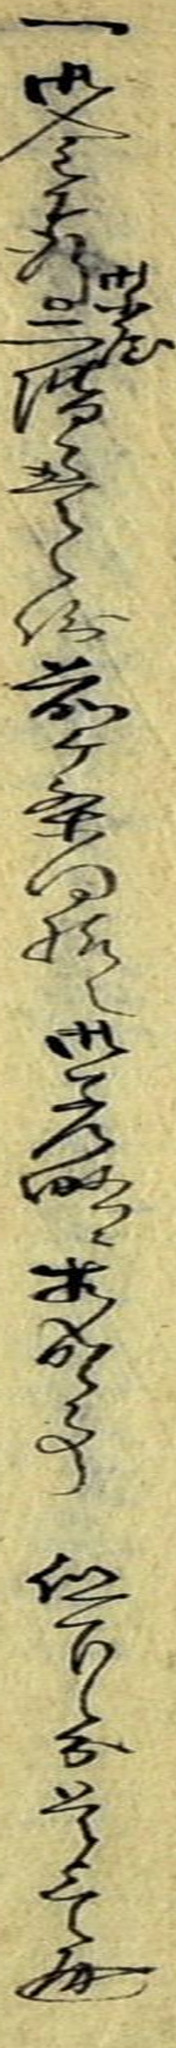一御金奉行御小屋二階畳之儀前ヶ条同様御差略に相成候事但下之分是迄之通
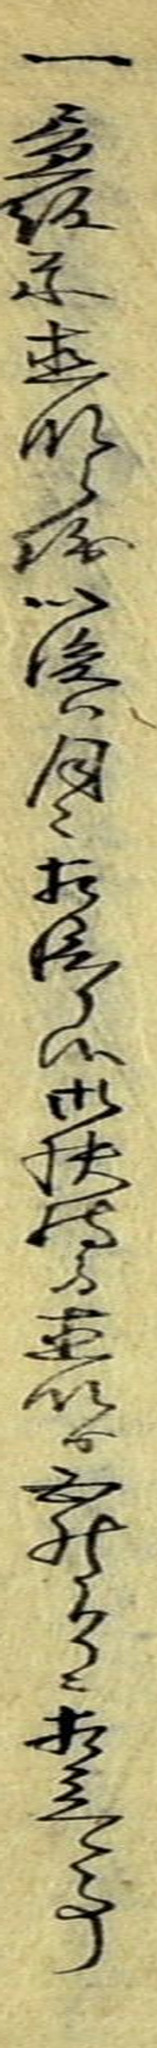一昼飯米直段之儀以後は月々相渡し候御扶持方直段ゟ五升下りに相立候事
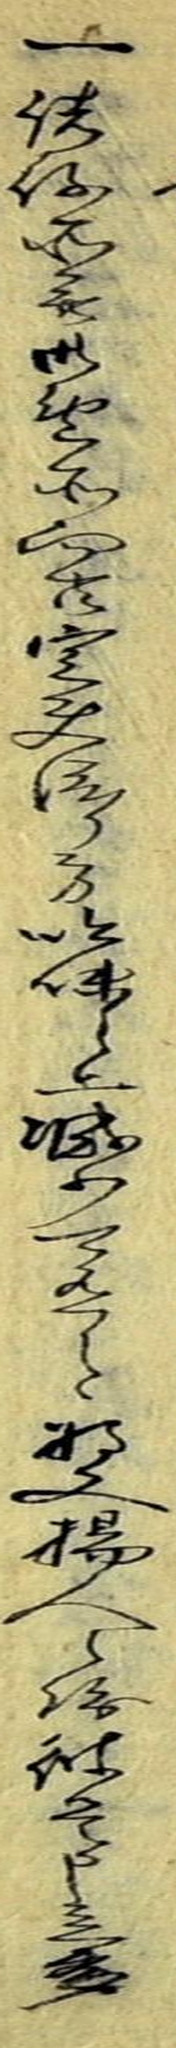一諸役所并御台所向共定夫渡り方吟味之上減少可有之候猶又揚人之儀彼是申立多
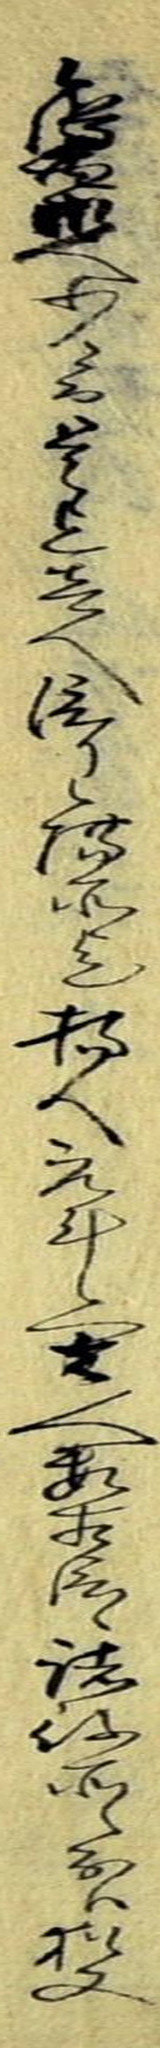候得共御人少人に而是迄壱人渡り之場所迄揚人取斗候へ共人数相渡候諸役所之分は猶又

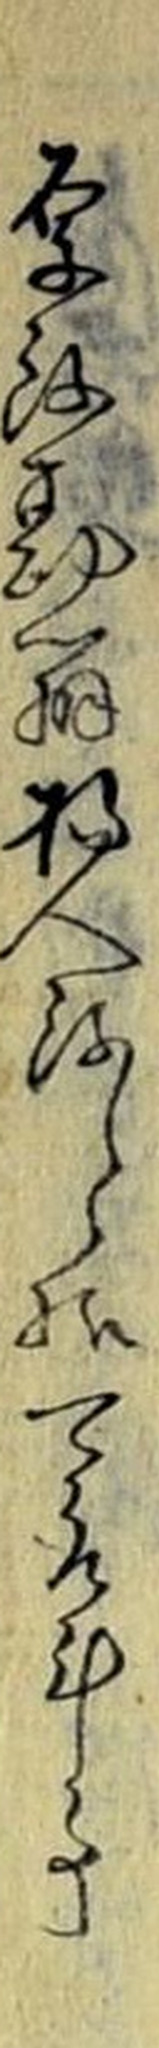厚致勘弁揚人致候様可取斗事
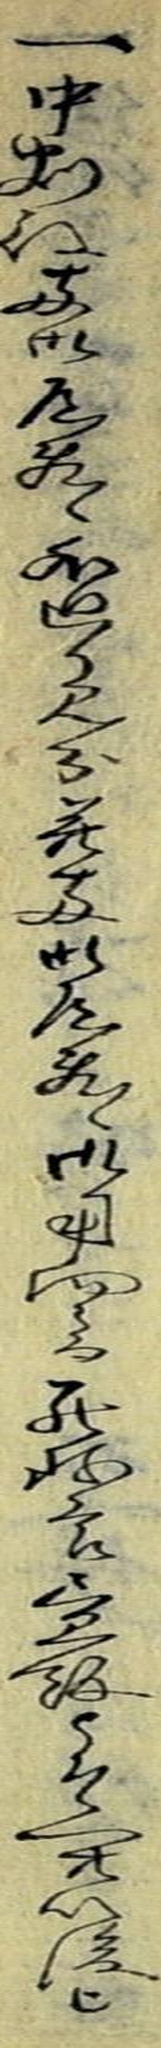一中判役両御屋敷へ外廻り見分并両御屋敷へ御用向に而罷越節昼飯被下候へ共以後被
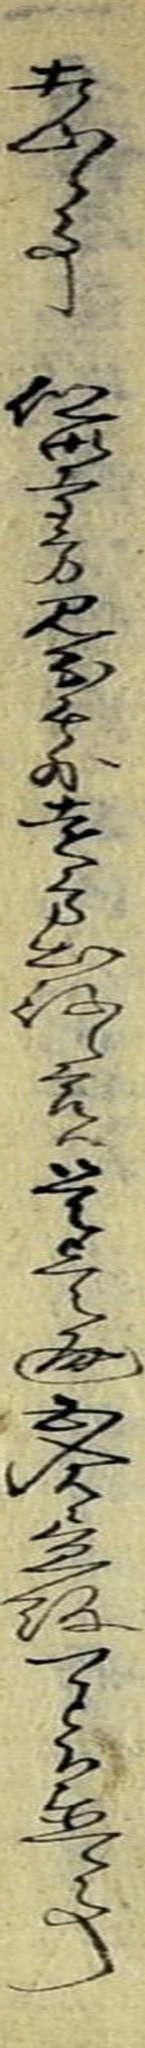相止候事但御寺方見分其外遠方出役候節は是迄之通五合昼飯被下置候事
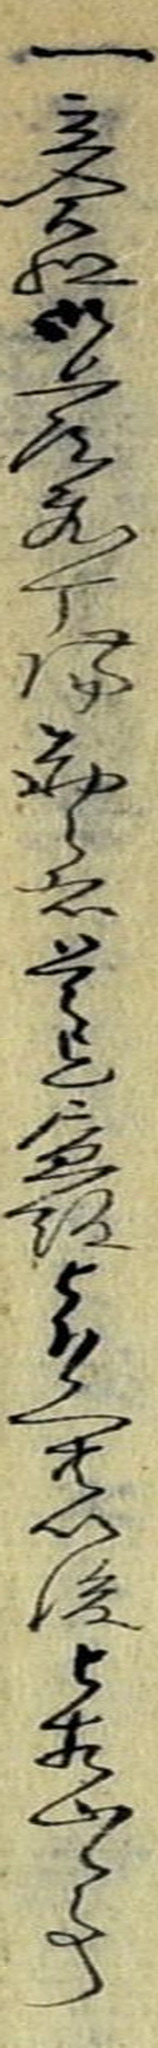一立合組御上屋敷丁場勤之者是迄昼飯被下候へ共以後被止候事
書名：命令之部 四
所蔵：福井県文書館 Fukui Prefectural Archives
